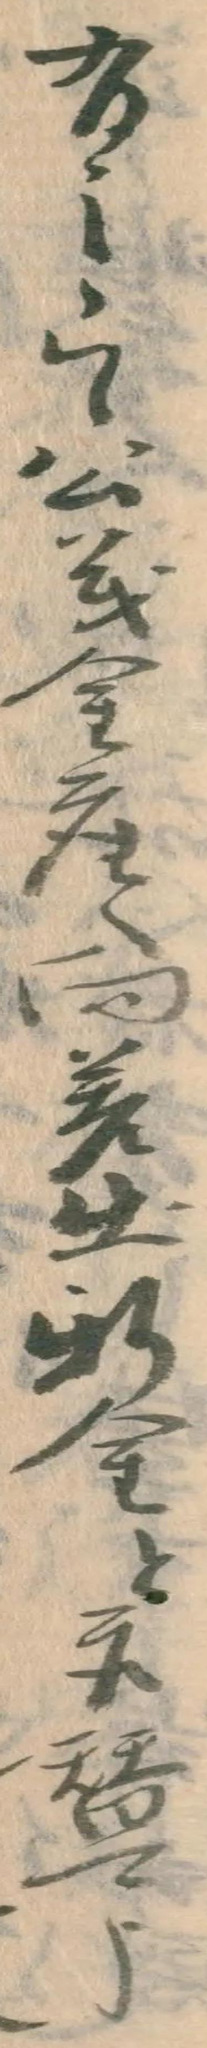有之候ハヽ、公義金座へ向差出、新金と取替可申、
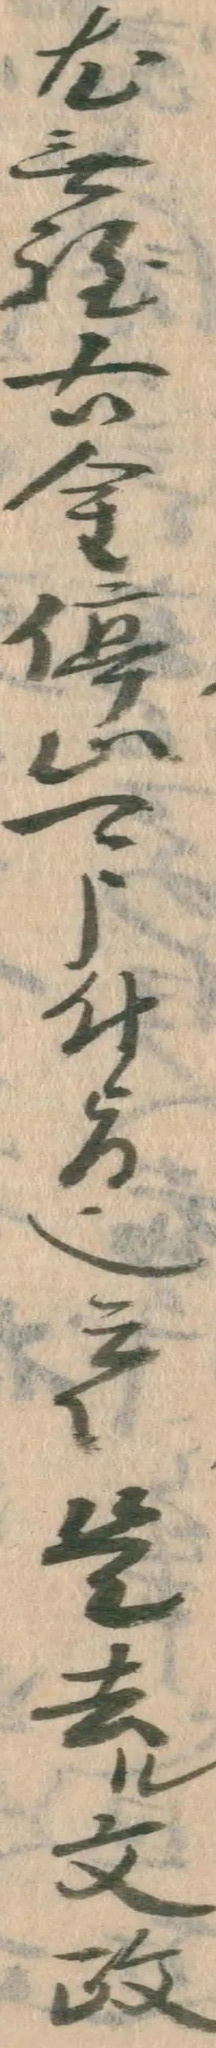尤無程古金停止可申付旨也云々、是去ル文政
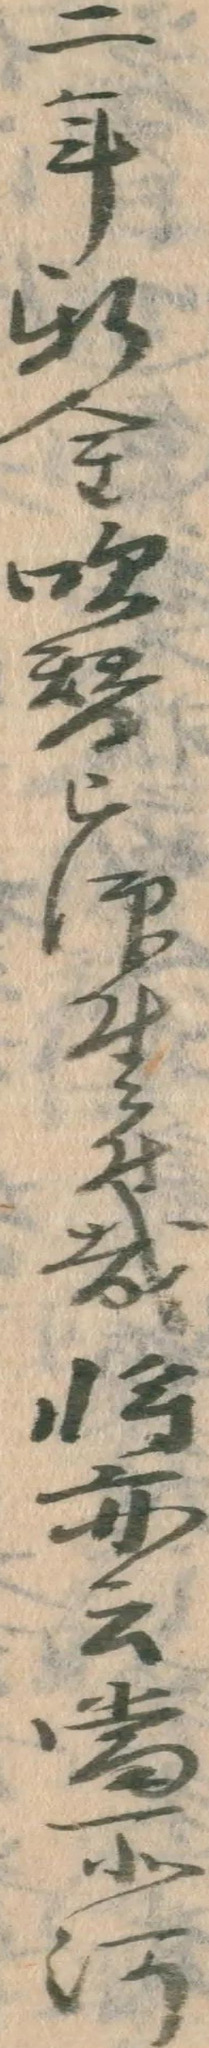二年新金吹替被仰付ニ付哉、将亦云當所河
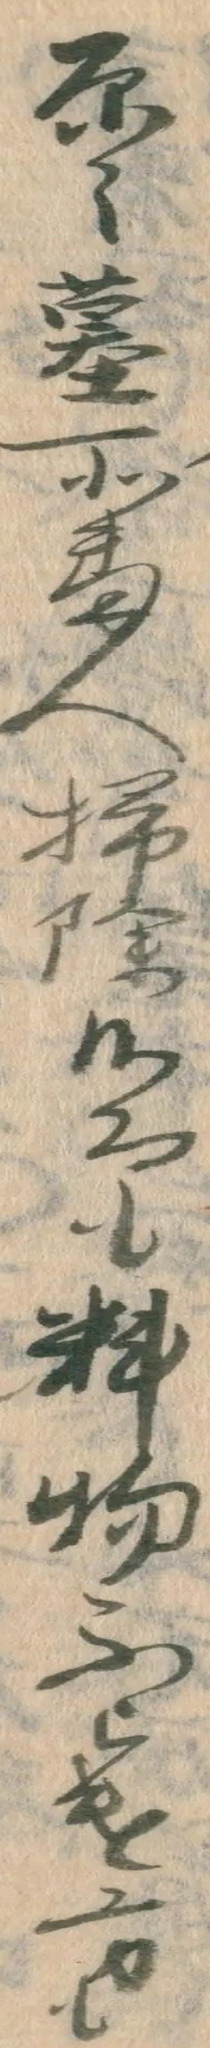原之墓所番人掃除候而も料物不被遣方も
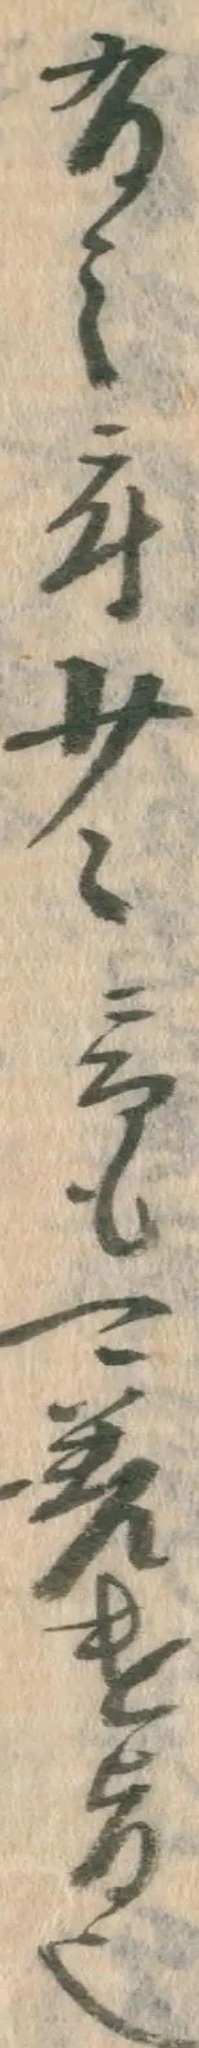有之ニ付、少々ニ而も可差遣旨也、
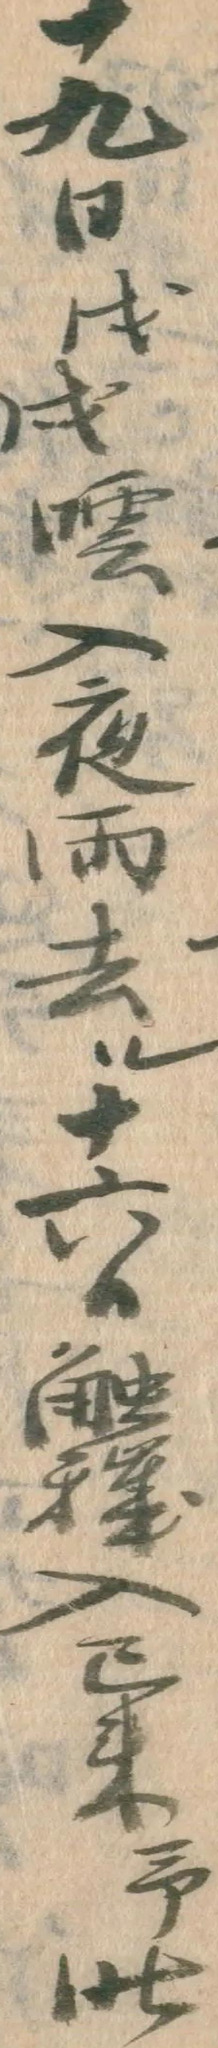十九日戊戌曇入夜雨、去ル十六日触穢入、已来予昨
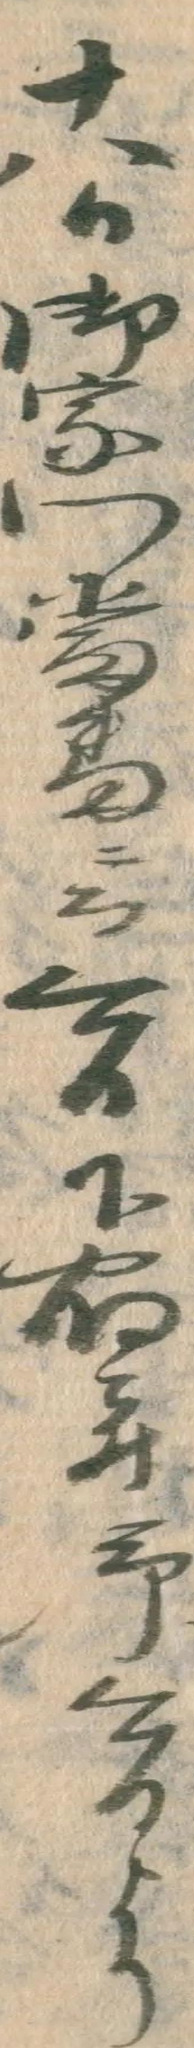十八日御家門當番ニ而、今日下宿ニ而、予今日より
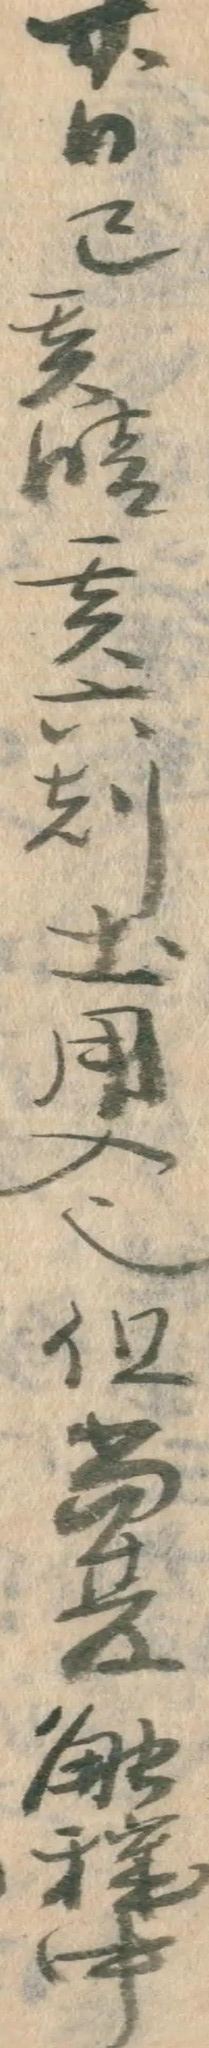廿日己亥晴、亥六刻土用入也、但當夏触穢中
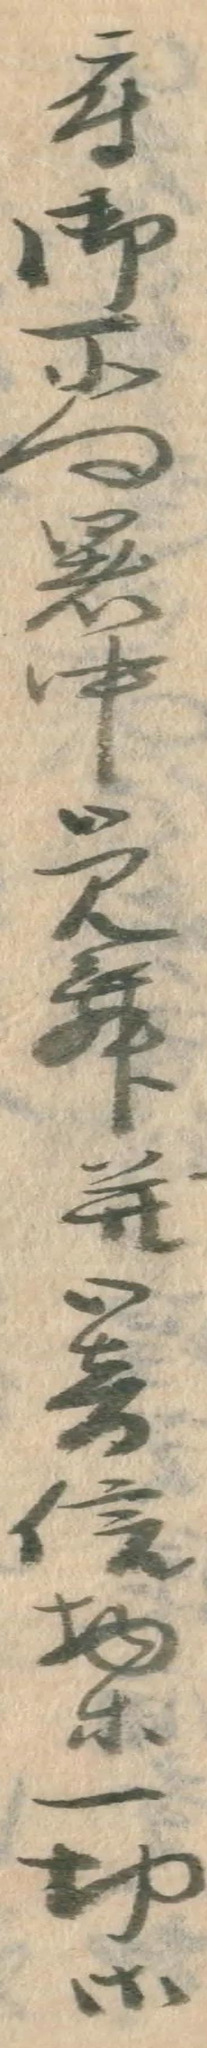ニ付御所向暑中御見舞并御音信物等一切御
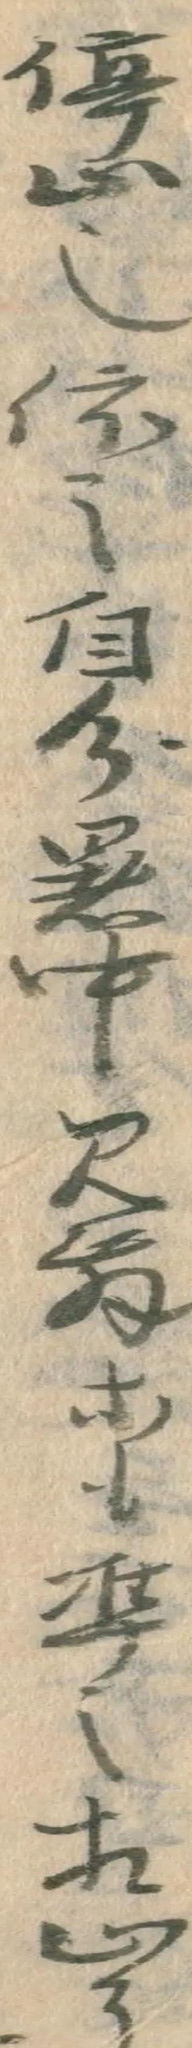停止也、依之自分暑中見舞等も之相止了、
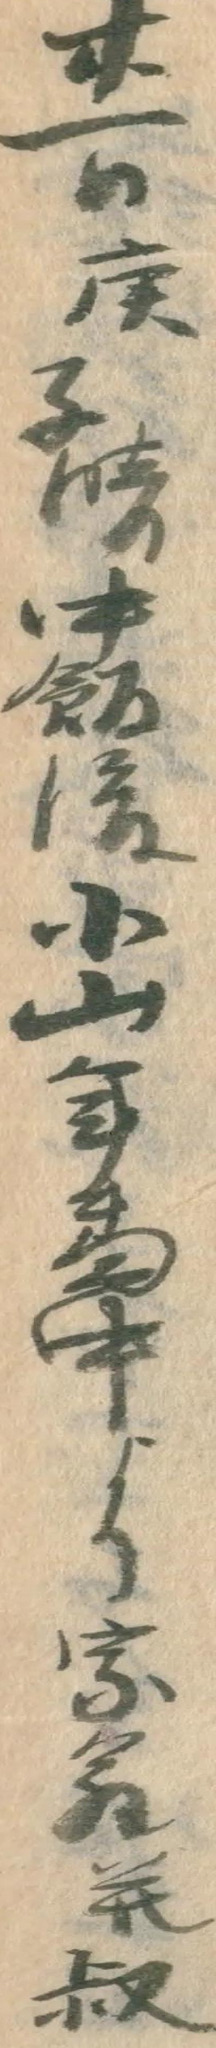廿一日庚子晴、中飯後小山年番中より宗翁幷叔

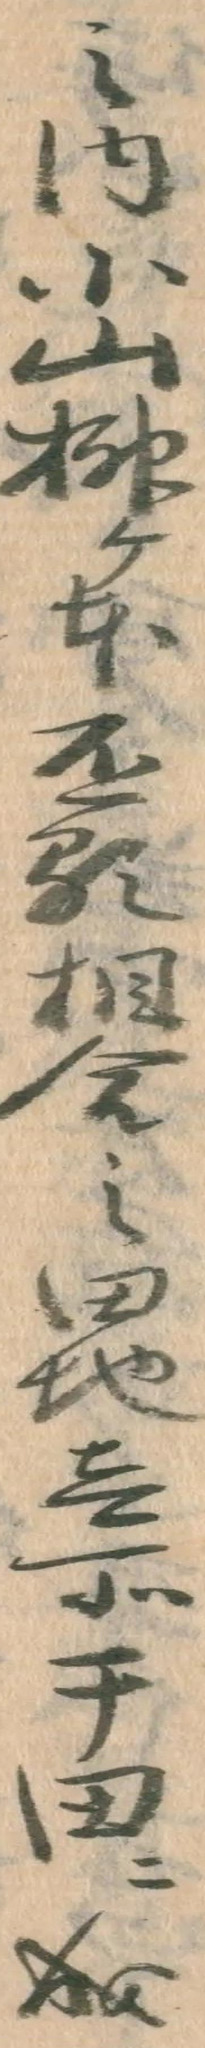之内小山柳ケ本、丕顕相合之田地壱所干田ニ成
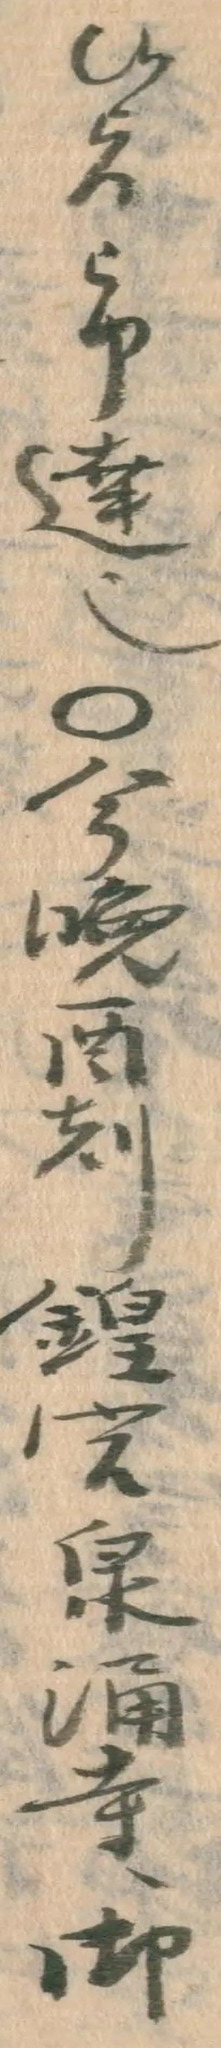候旨被申達也、○今晩酉刻鍠宮泉涌寺へ御
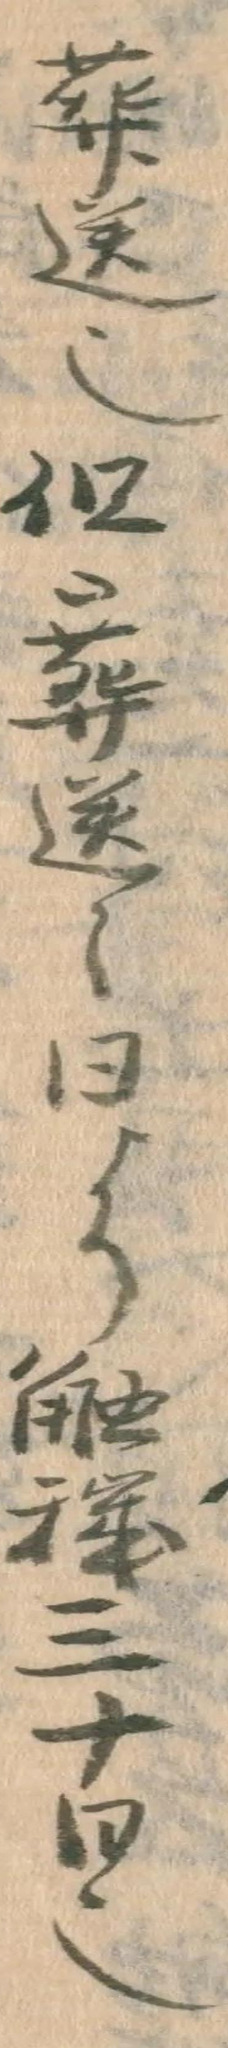葬送也、但御葬送之日より触穢三十日也、
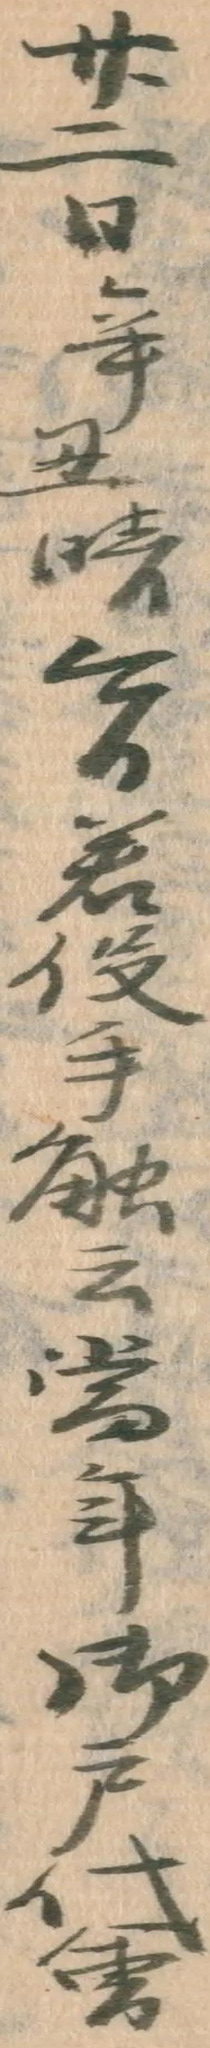廿二日辛丑晴、今日若役手触云、當年御戸代會
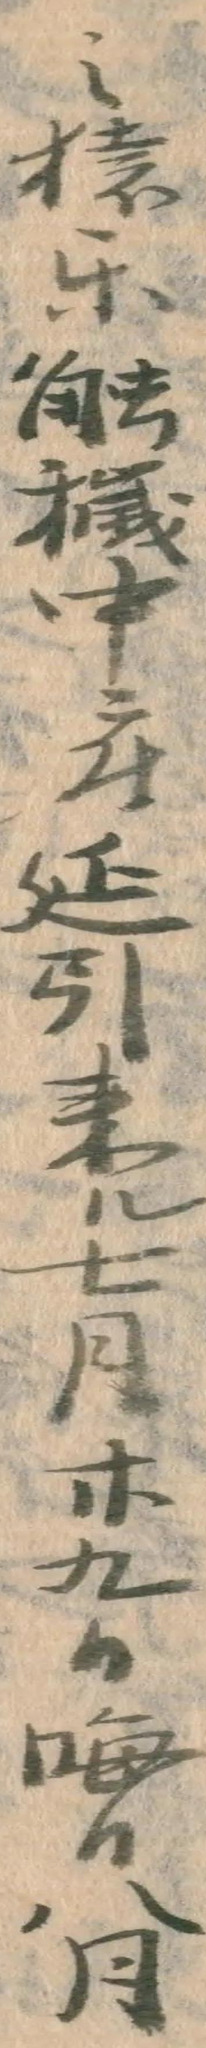之猿楽、触穢中ニ付延引、来ル七月廿九日晦日・八月
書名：賀茂社記録. 第63冊
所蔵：国立国会図書館 National Diet Library, JAPAN
